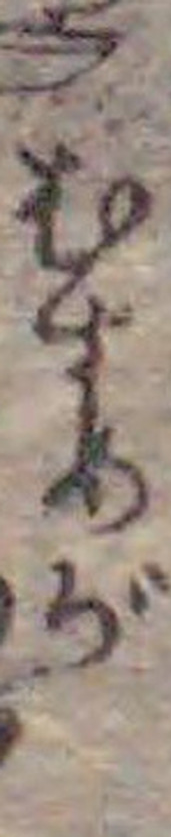むすめが
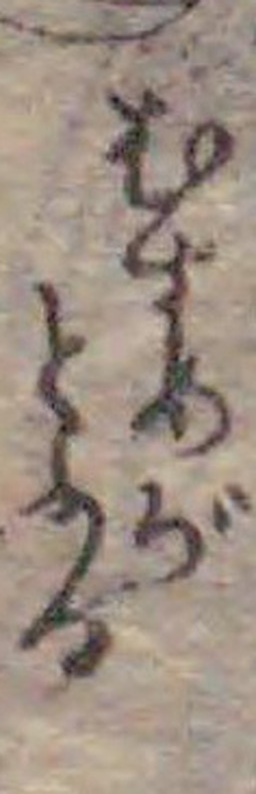とふる
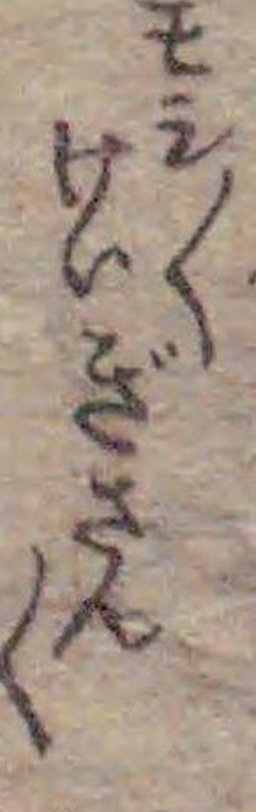けいぎさん

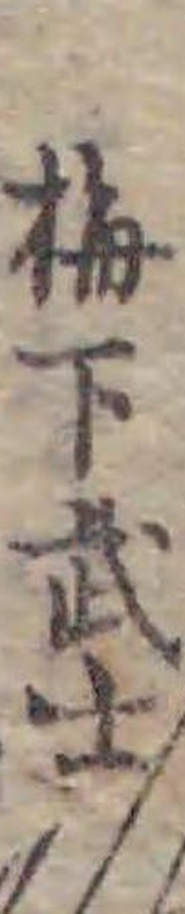梅下武士
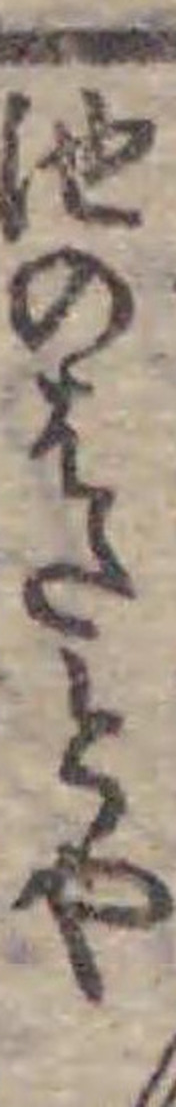池のはたとや
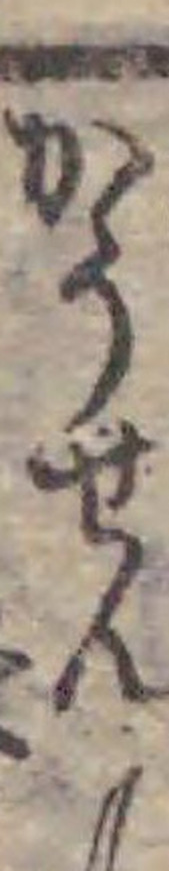かうせん
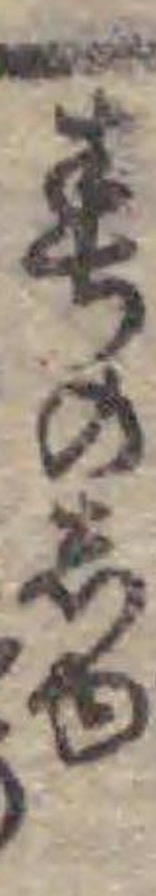春のしゆ
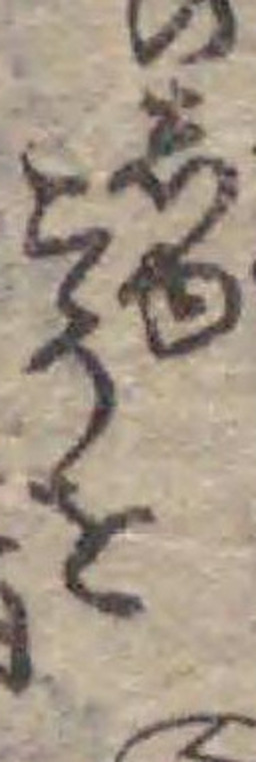こうを
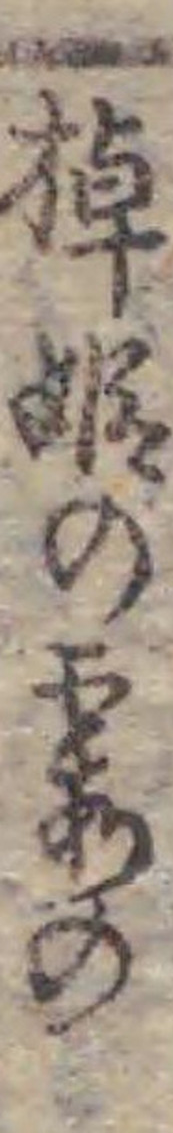棹姫の霞の
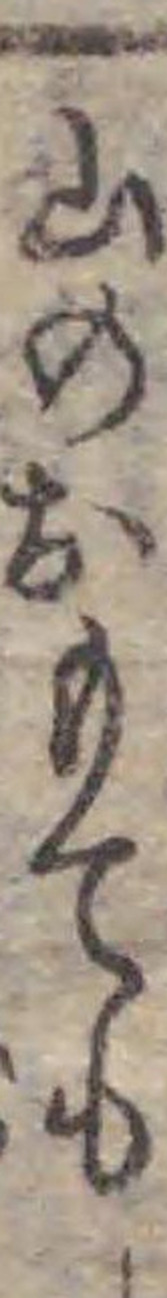山のおもても
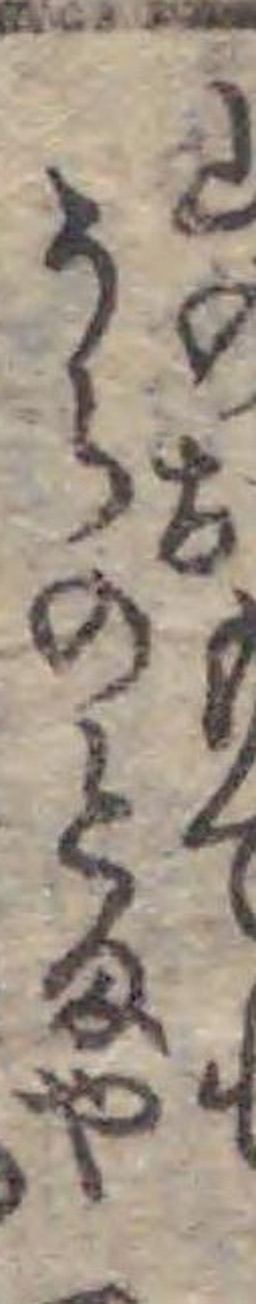うらのとまや
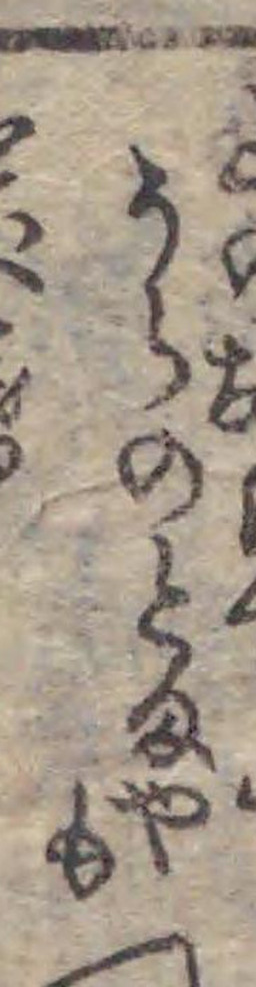うらのとまや
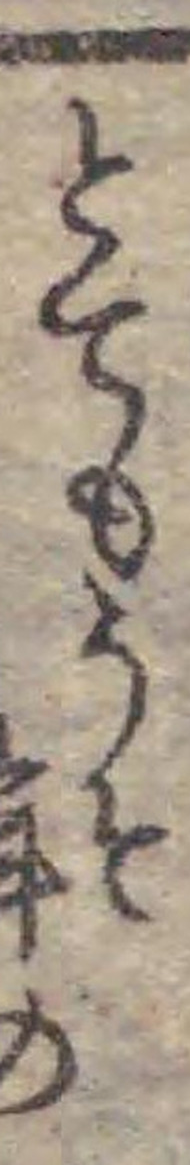とてもうそ
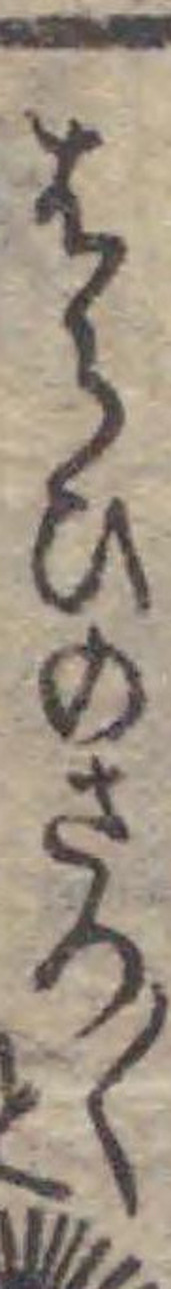はらひのさつ〳〵
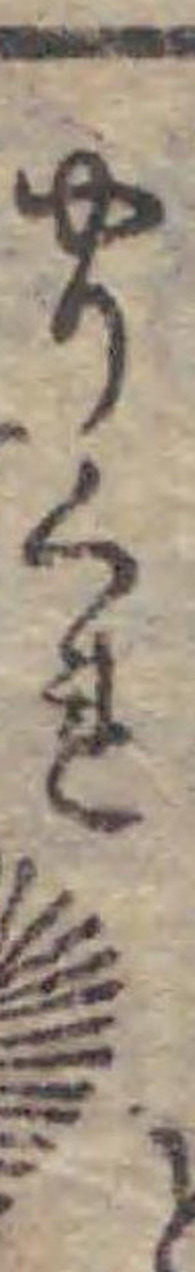やりくれ
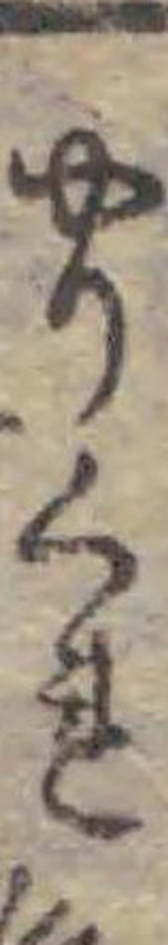やりくれ
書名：年始御礼帳 : 3巻
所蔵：国立国会図書館 National Diet Library, JAPAN
